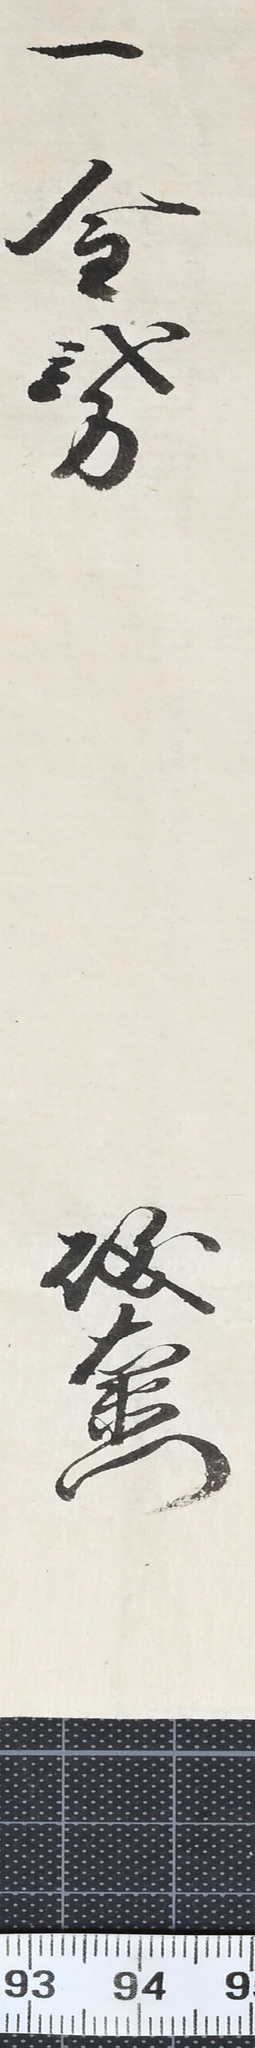一金弐分磯右衛門
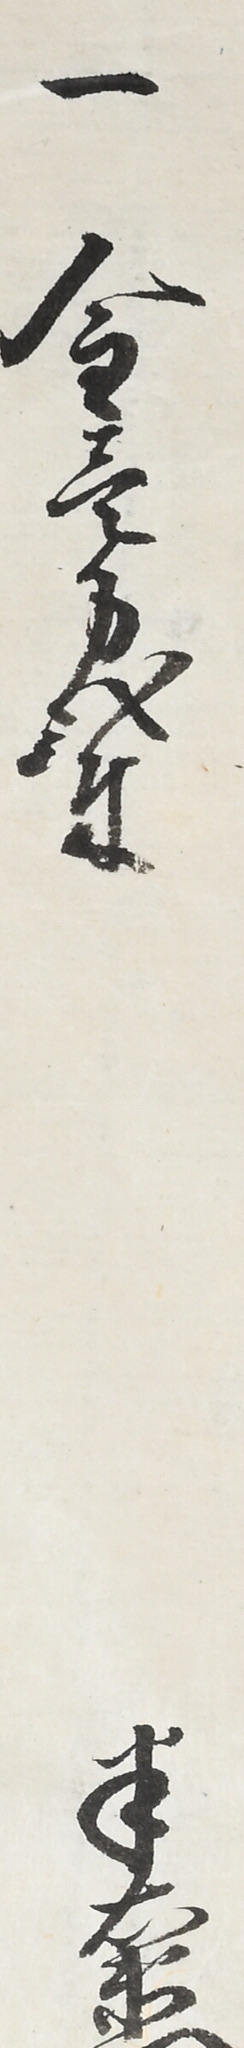一金壱分弐朱半右衛門
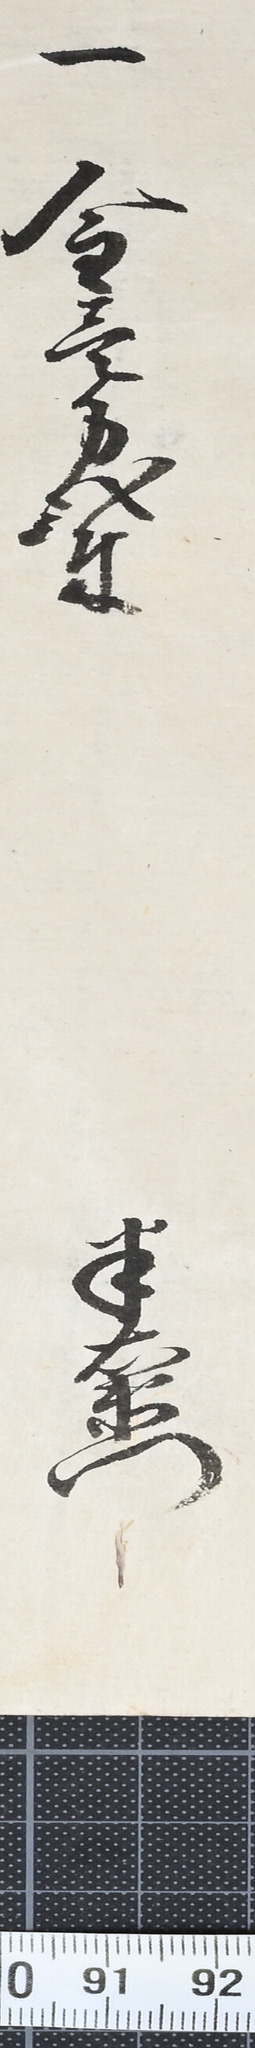一金壱分弐朱半右衛門
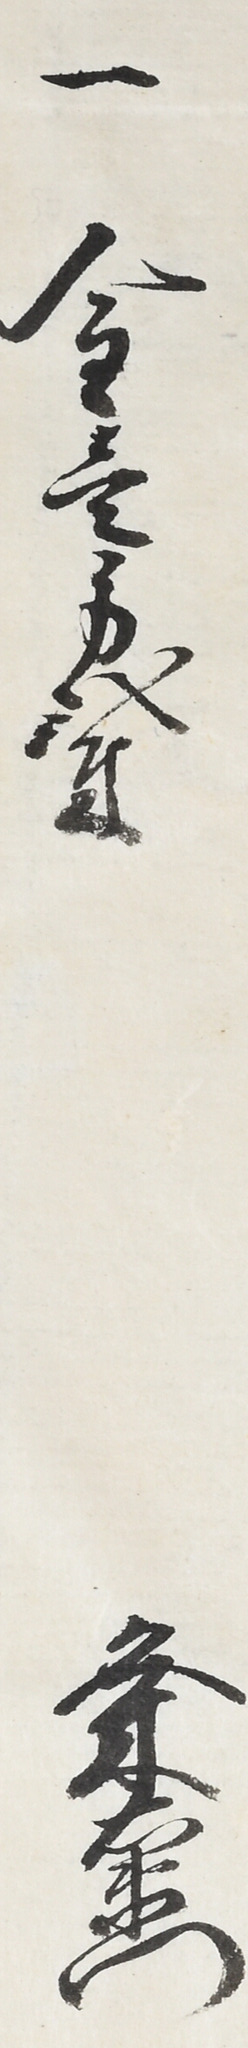一金壱分弐朱粂右衛門

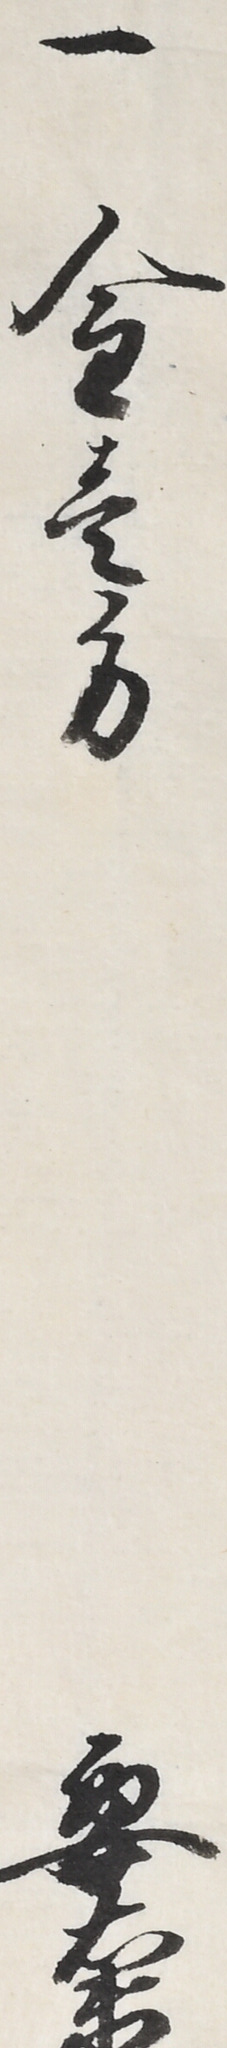一金壱分要右衛門
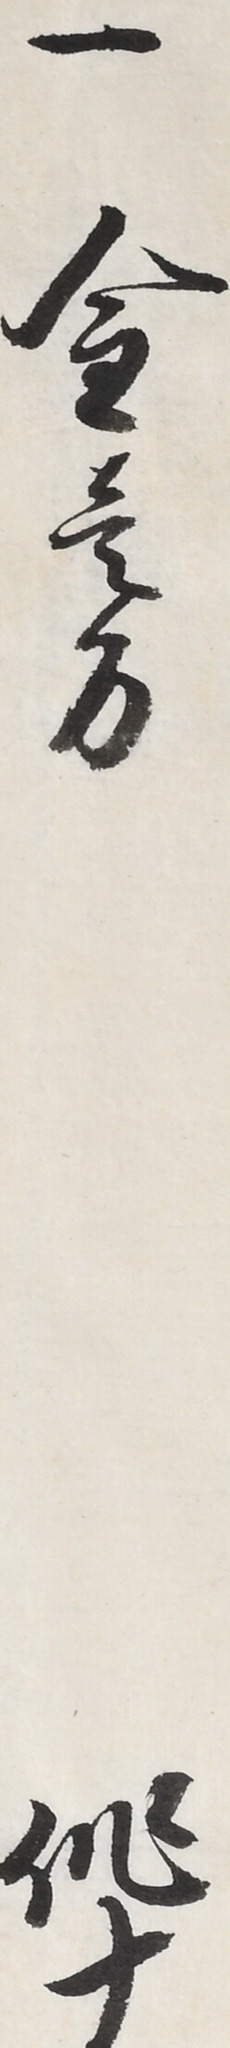一金壱分作十郎
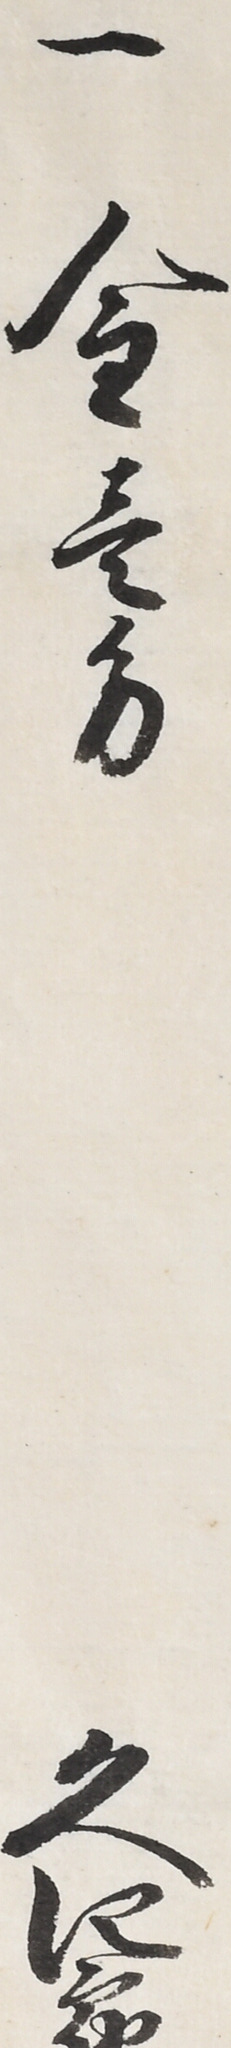一金壱分久四郎
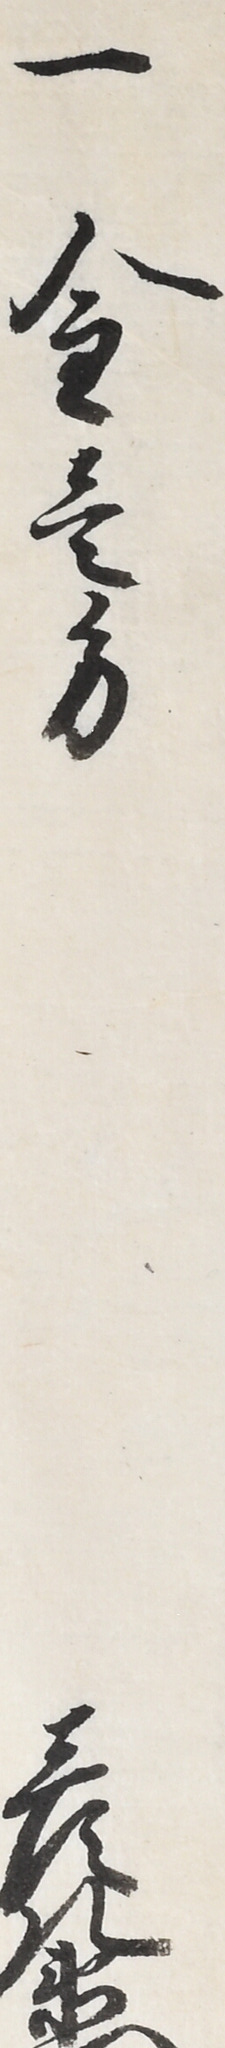一金壱分彦左衛門
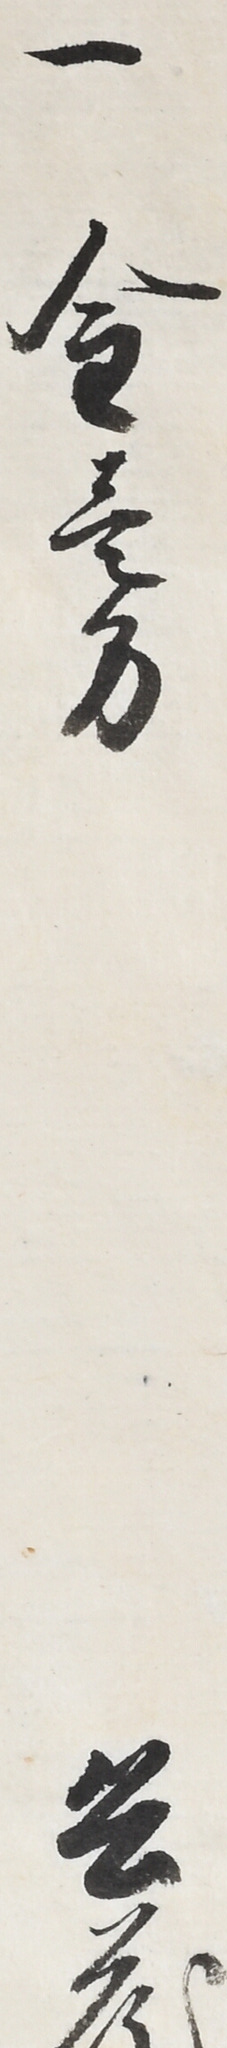一金壱分兵蔵
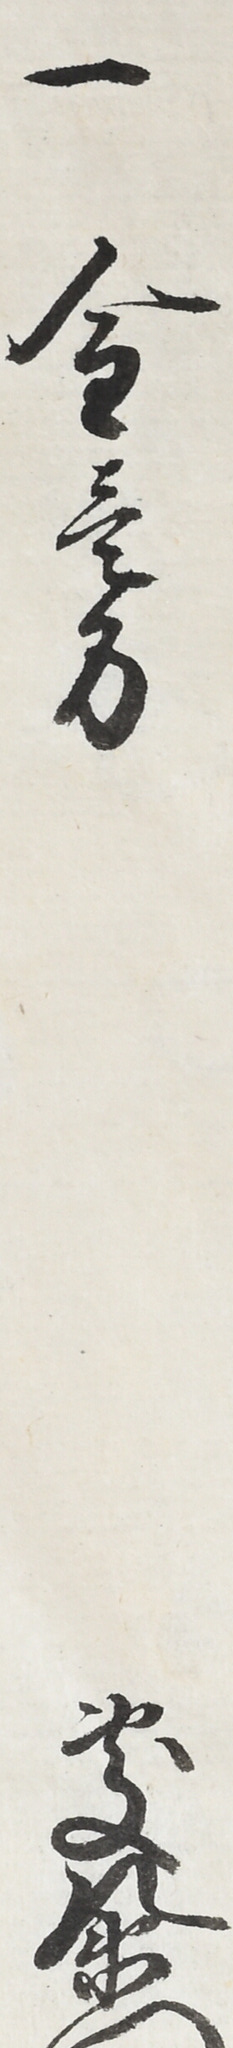一金壱分嘉蔵

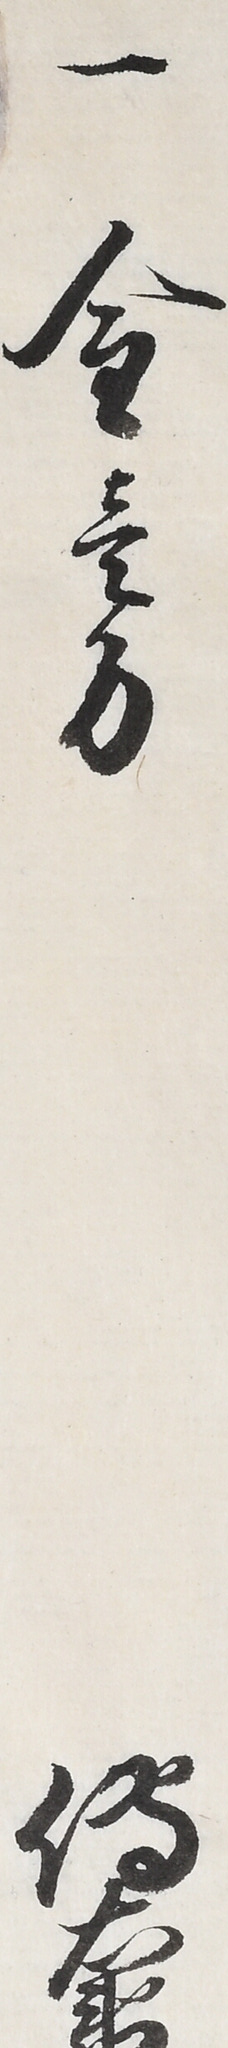一金壱分伝右衛門
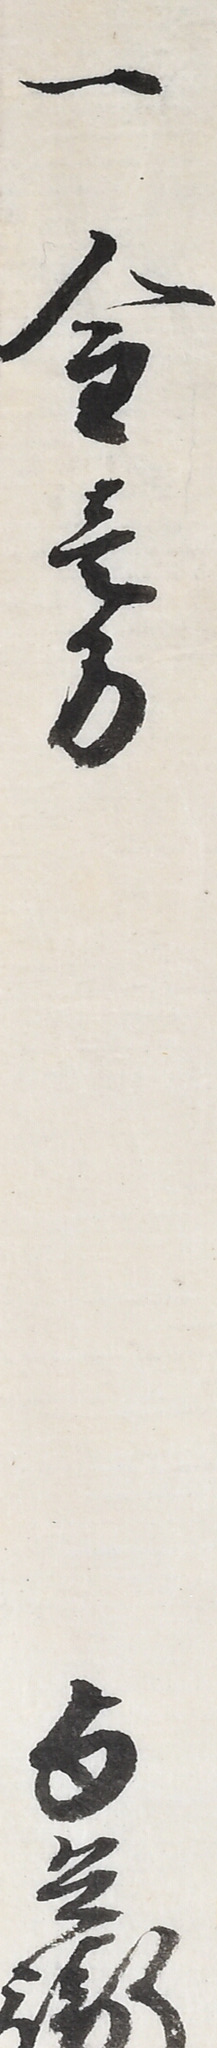一金壱分与兵衛
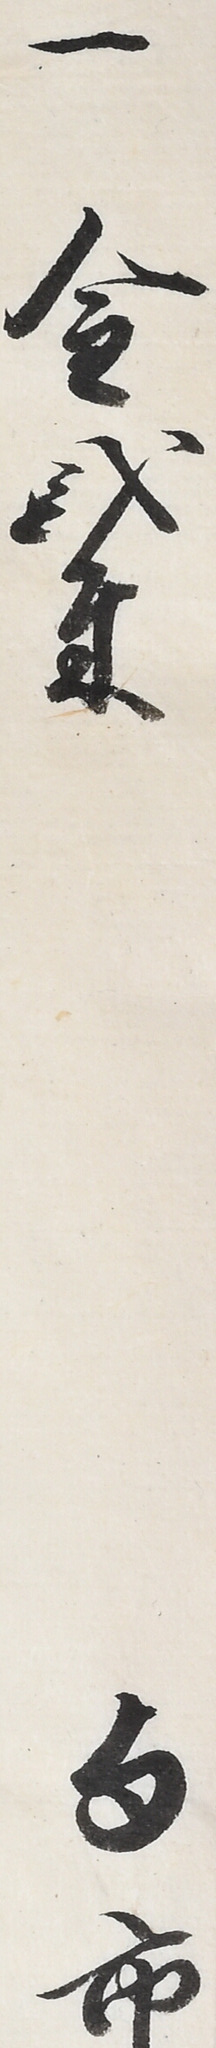一金弐朱与市
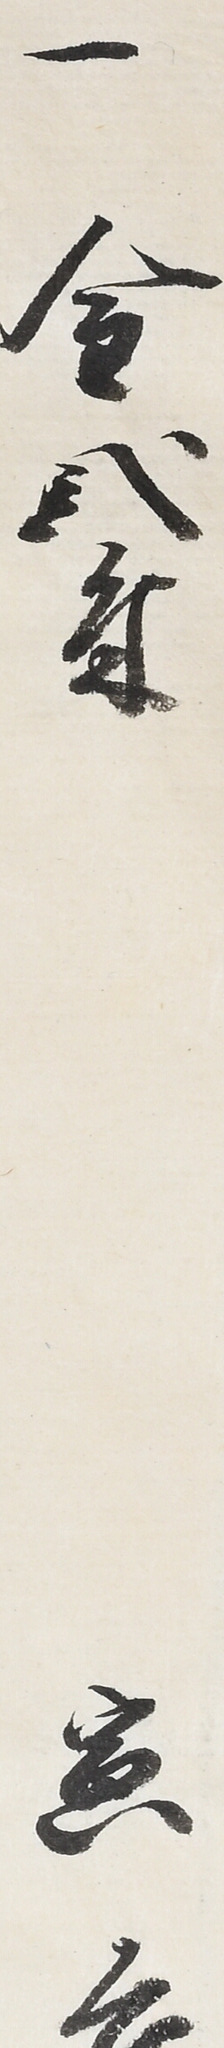一金弐朱寅吉
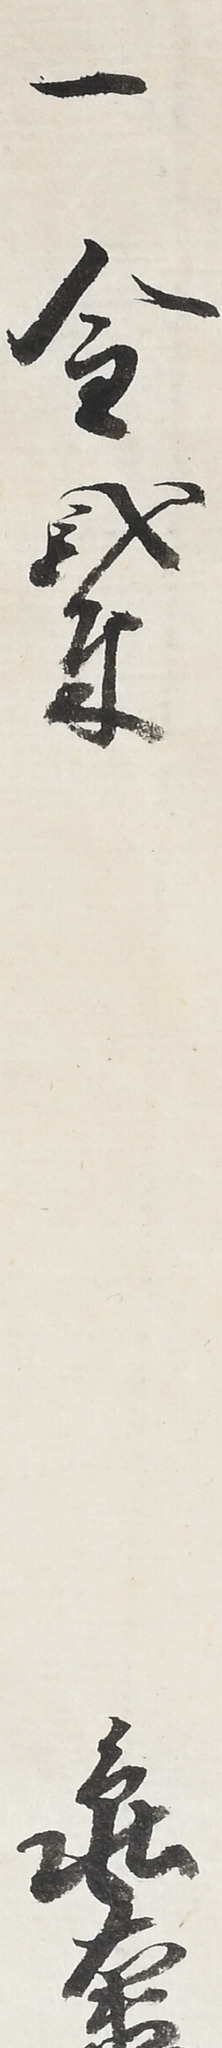一金弐朱亀右衛門
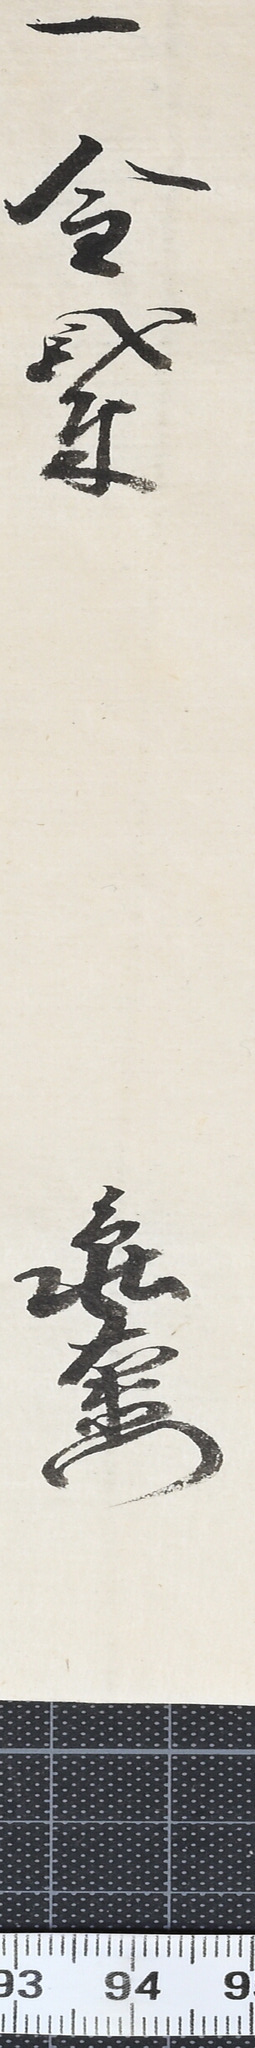一金弐朱亀右衛門
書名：御拝地百五拾年御祝儀献上御目録名前
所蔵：伊那市立高遠町図書館・合同会社AMANE
